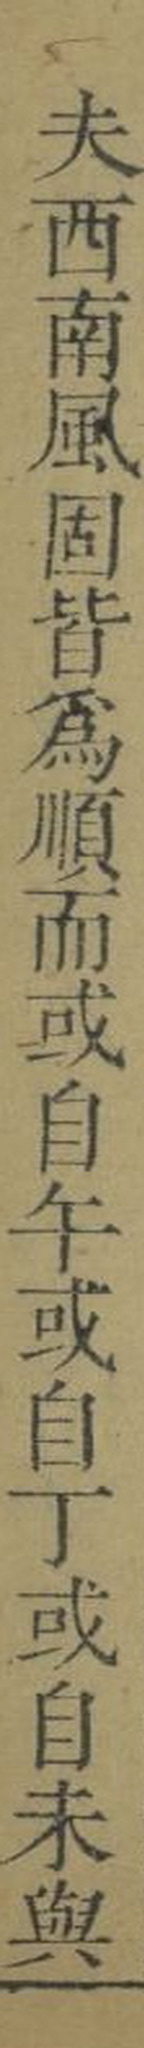夫西南風固皆爲順而或自午或自丁或自未與

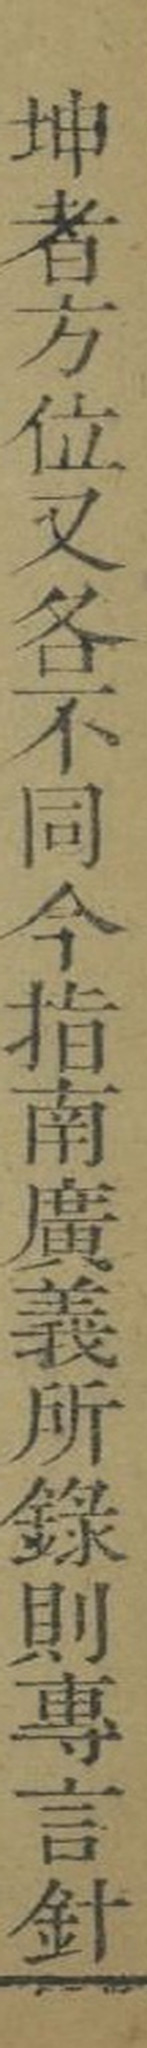坤者方位又各不同今指南廣義所錄則專言針
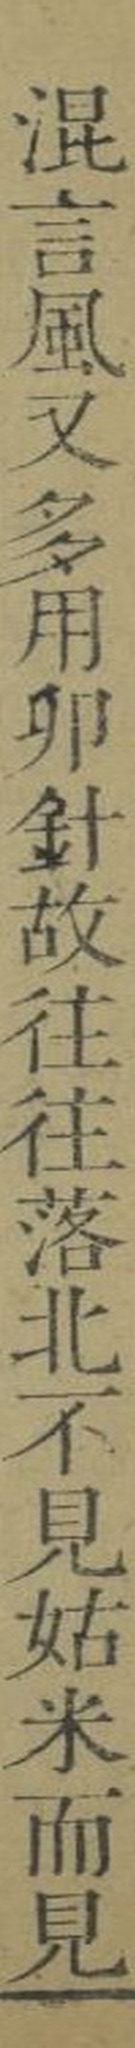混言風又多用卯針故往往落北不見姑米而見
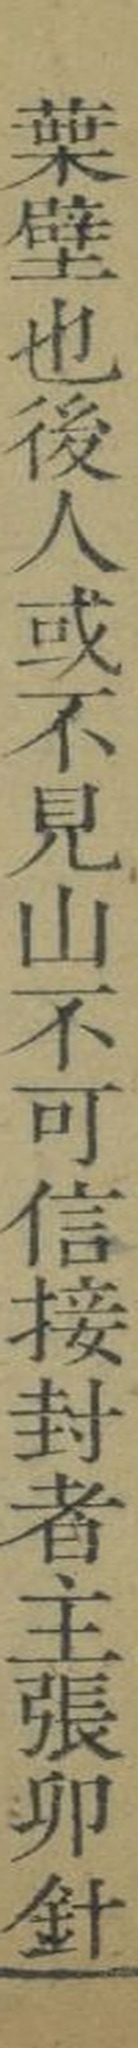葉壁也後人或不見山不可信接封者主張卯針
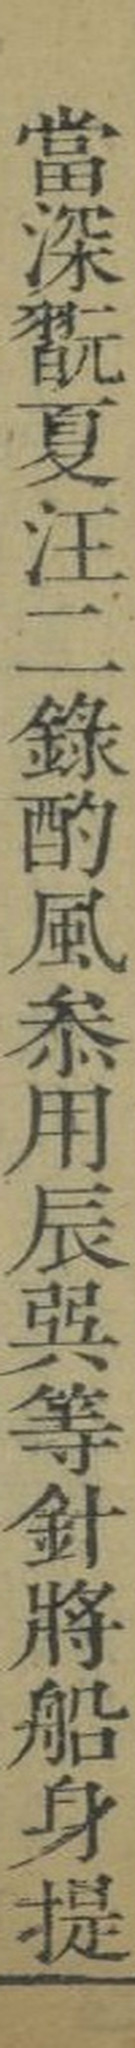當深翫夏汪二錄酌風叅用辰㢲等針將船身提
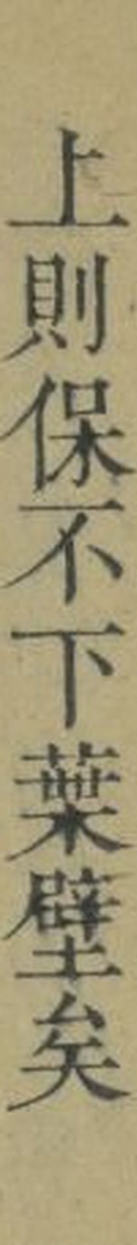上則保不下葉壁矣
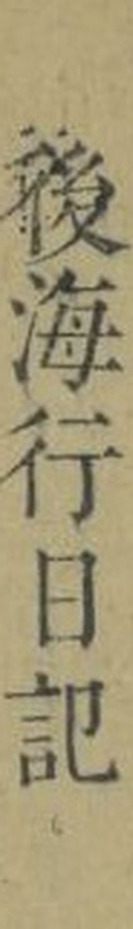後海行日記
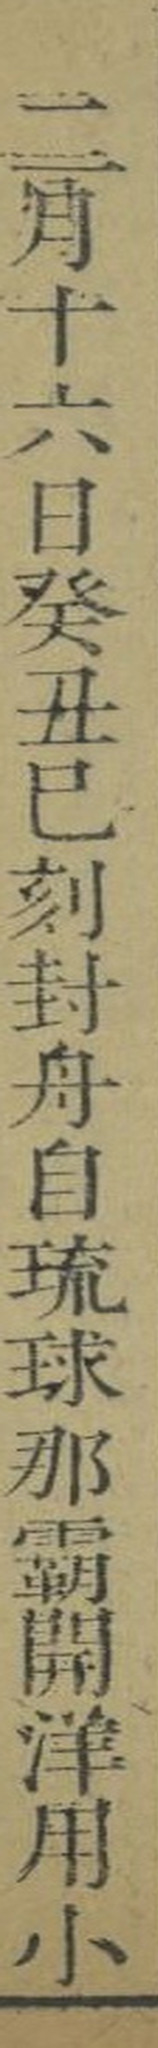二月十六日癸丑巳刻封舟自琉球那霸開洋用小
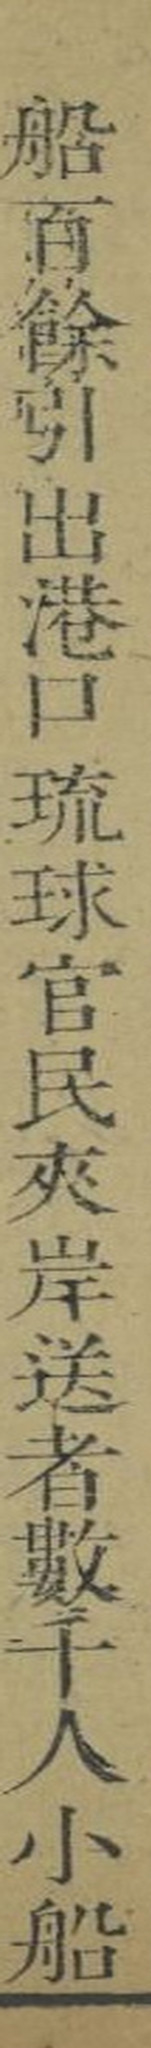船百餘引出港口琉球官民夾岸送者數千人小船
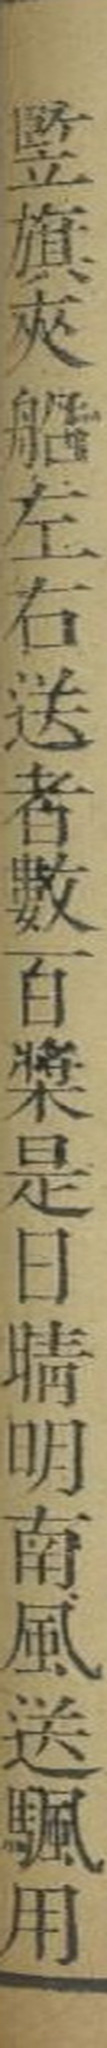堅旗夾船左右送者數百槳是日晴明南風送颿用
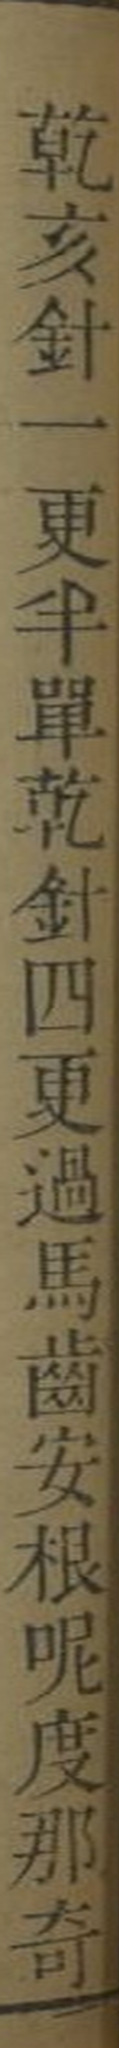乾亥針一更半單乾針四更過馬齒安根呢度那奇
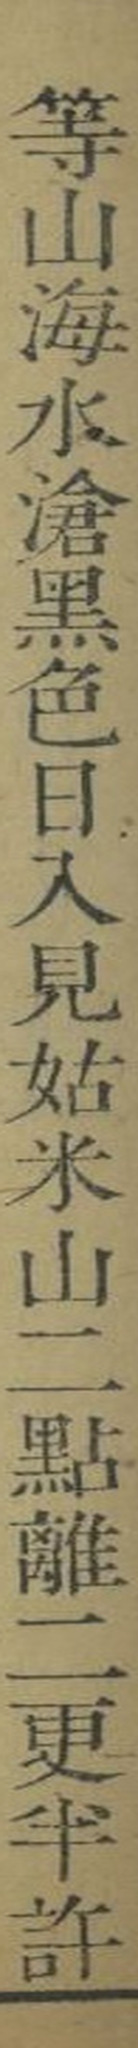等山海水滄黑色日入見姑米山二點離二更半許
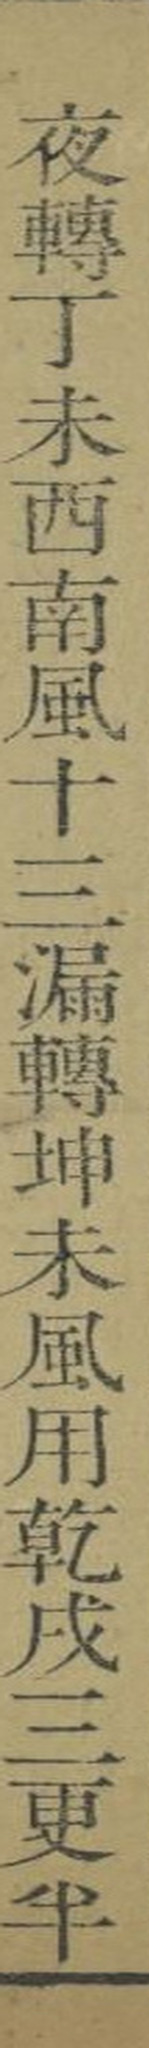夜轉丁未西南風十三漏轉坤未風用乾戌三更半
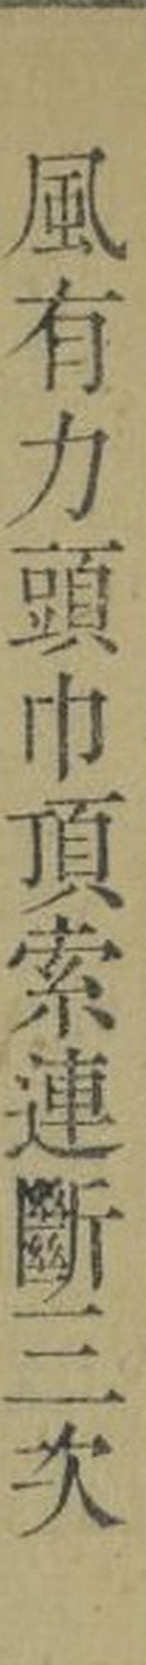風有力頭巾頂索連斷三次
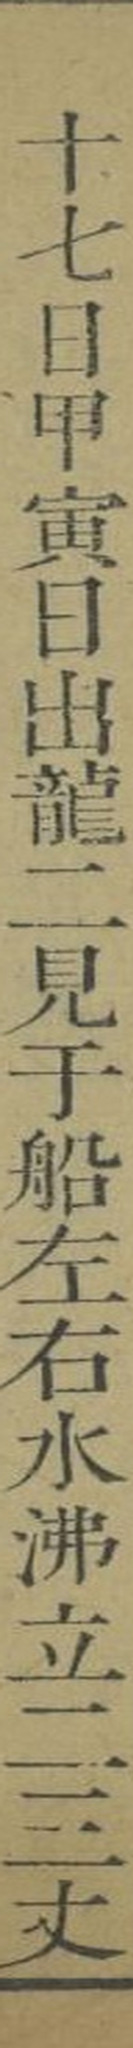十七日甲寅日出龍二見于船左右水沸立二三丈
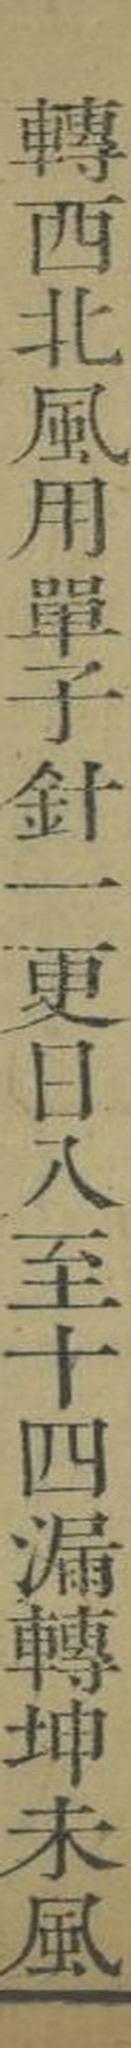轉西北風用單子針一更日入至十四漏轉坤未風
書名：中山伝信録 巻一
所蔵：University of the Ryukyus Library
